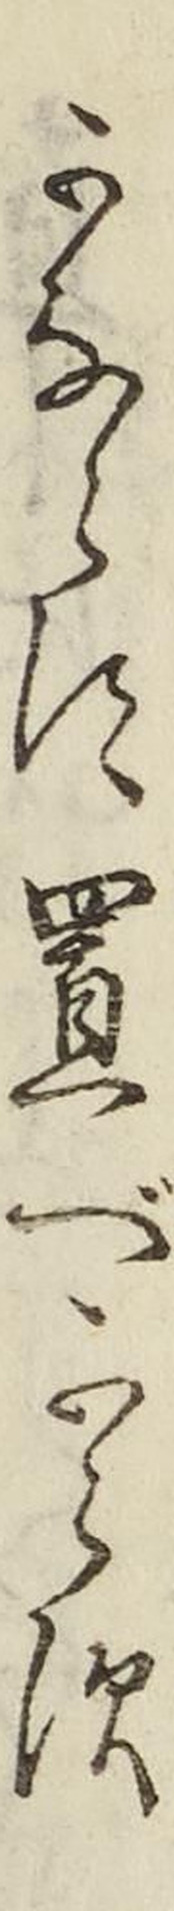かならす置べからす
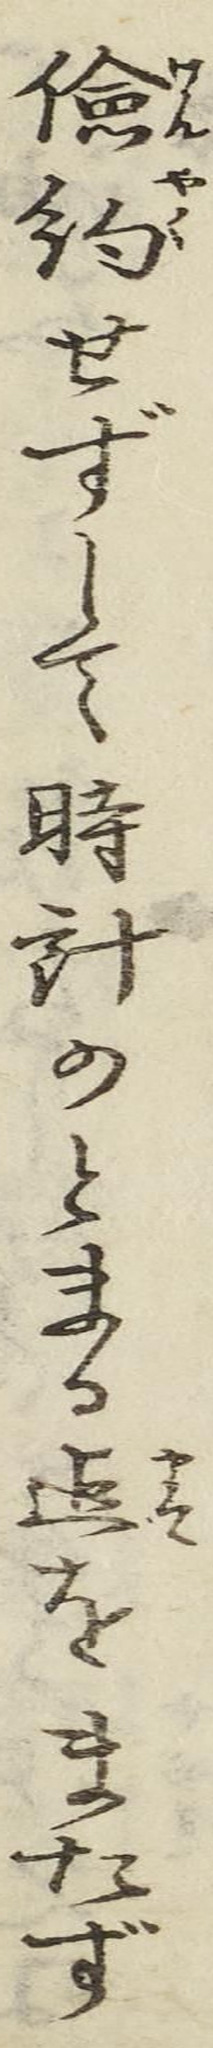倹約せずして時計のとまる迄をまたず
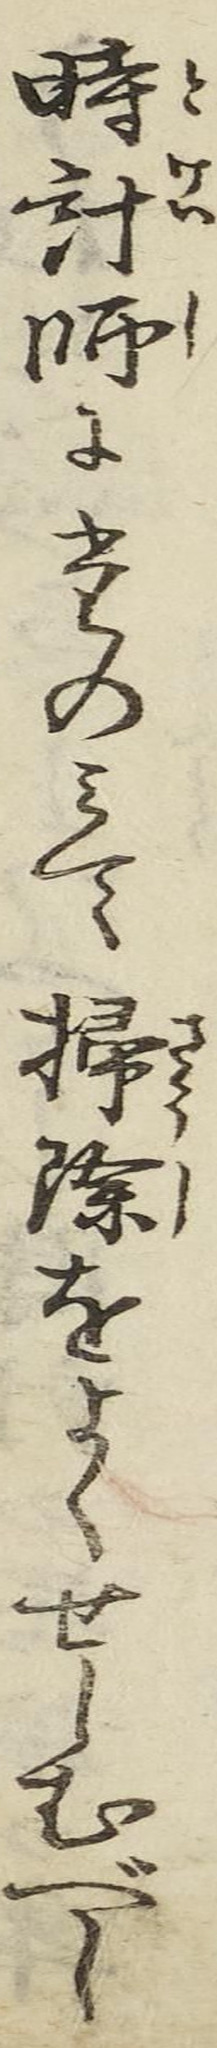時計師にたのみて掃除をよくせしむべし

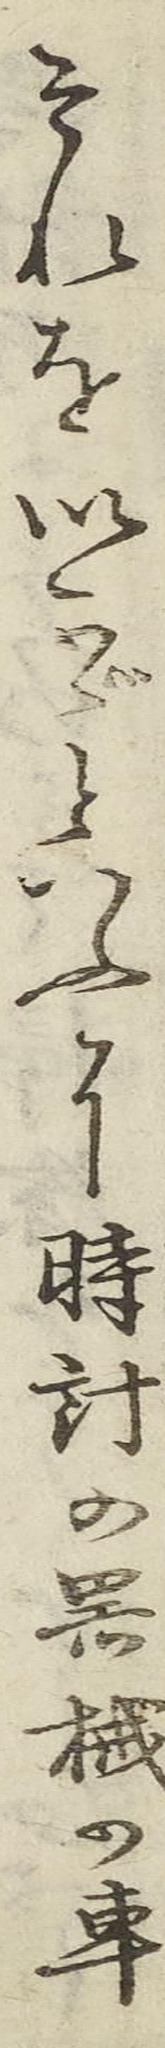それをいかゞといふに時計の器械の車
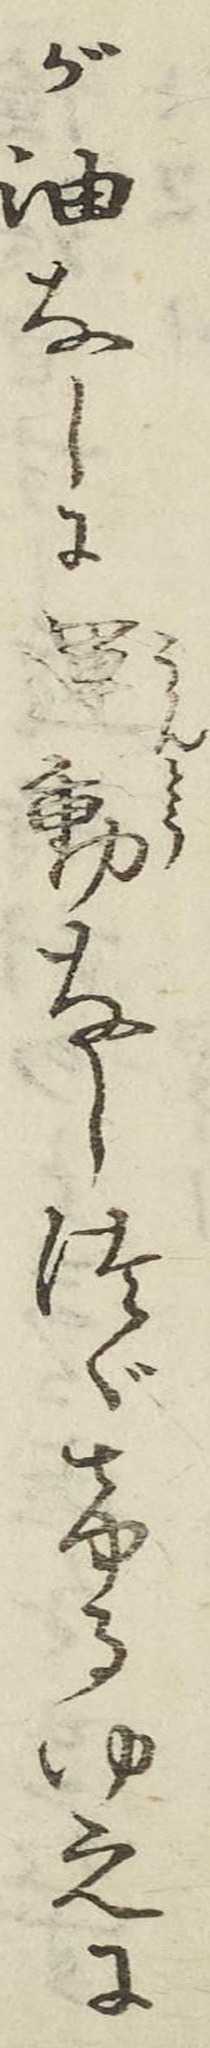が油なしに運動なしつゞけるゆえに
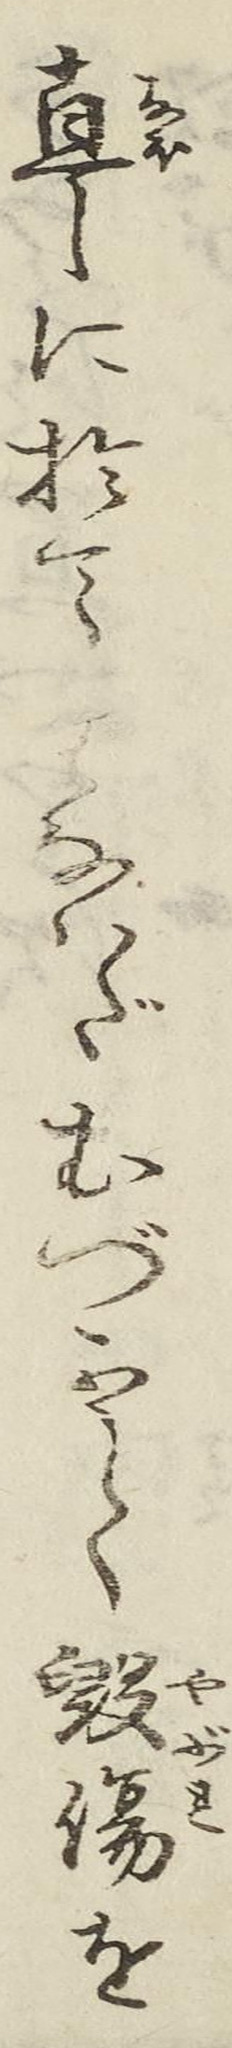直しに於てはなはだむづかしく毀傷を
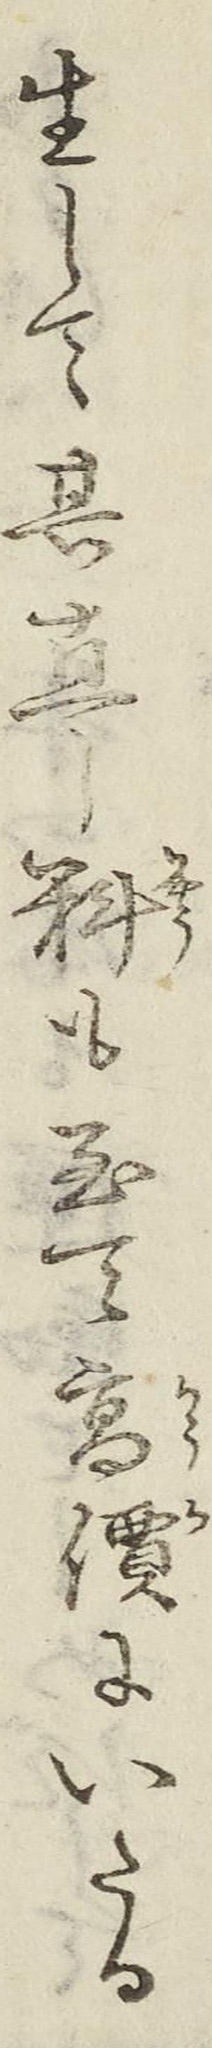生して其直し料も至て高価にいたる
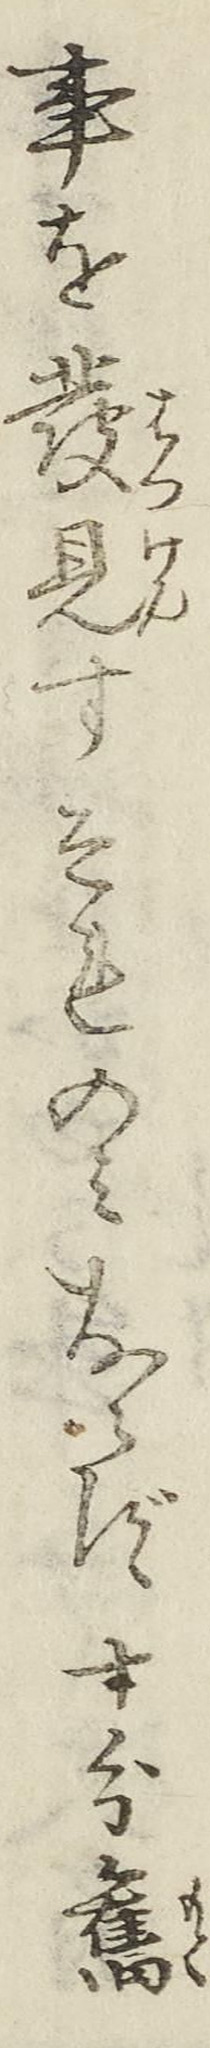事を発見すそれのみならず十分旧
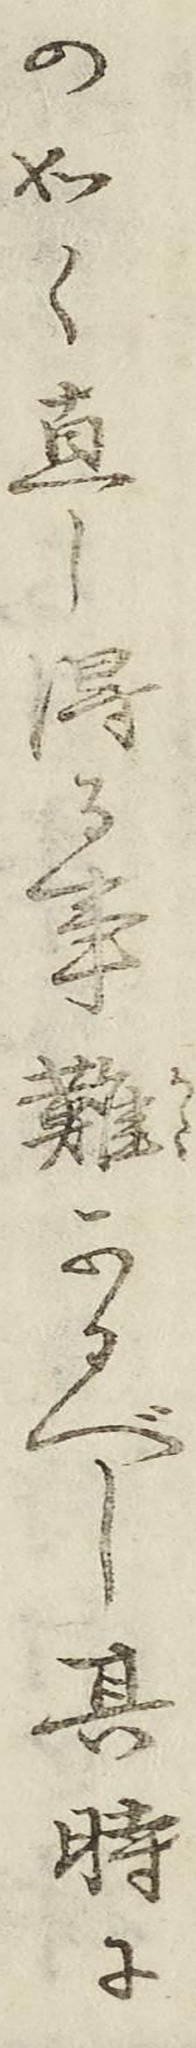の如く直し得る事難かるべし其時に
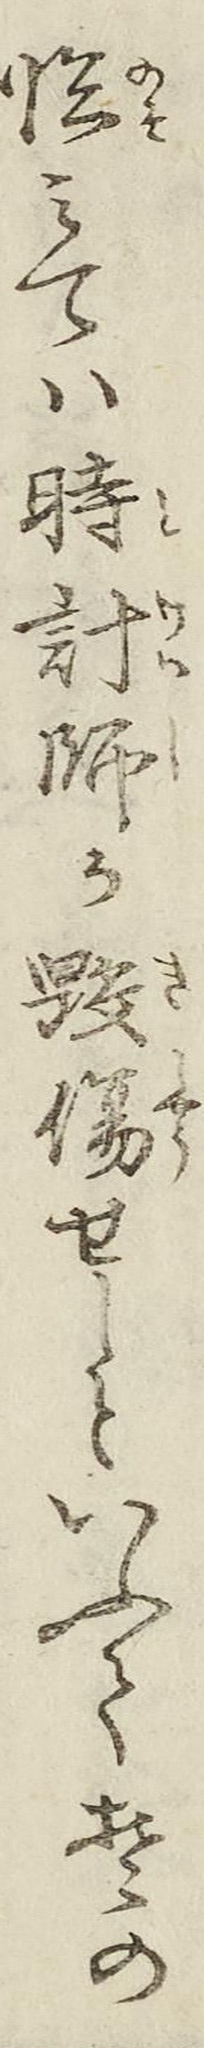臨みては時計師か毀傷せしといふてその
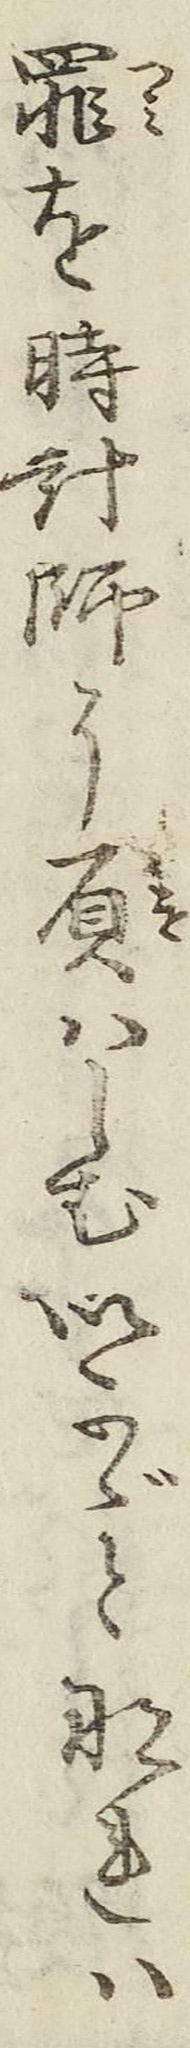罪を時計師に負はしむいかがとなれは
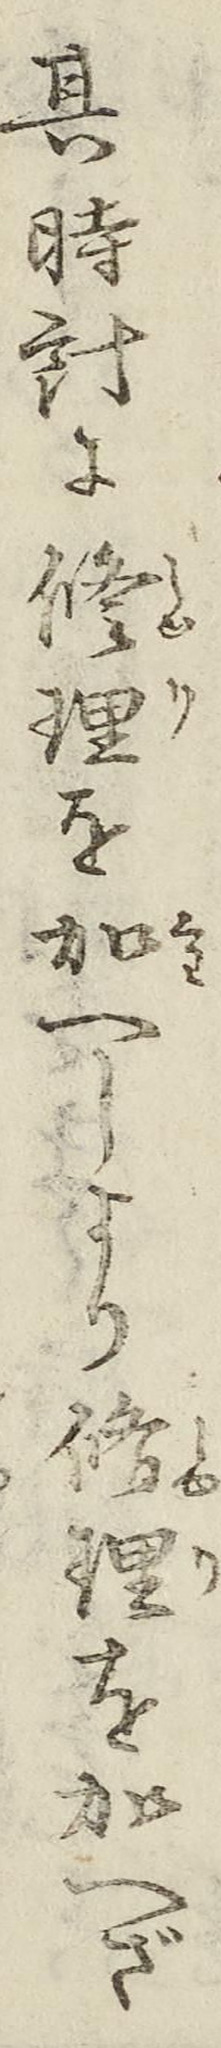其時計に修理を加へしより修理を加へざ
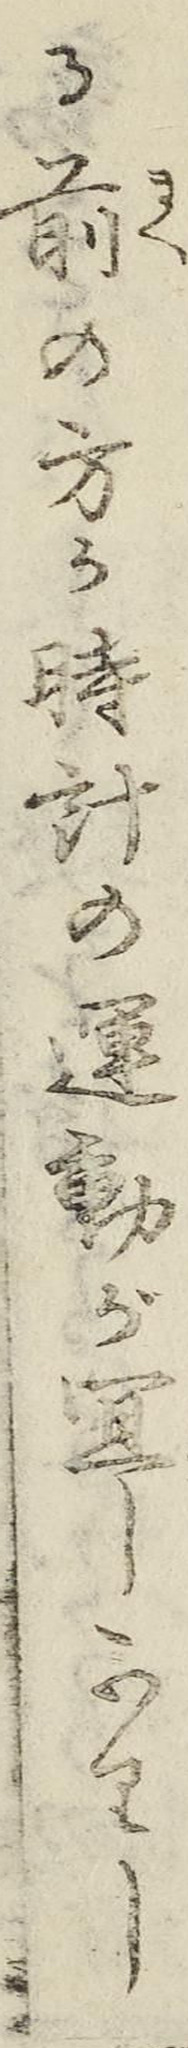る前の方か時計の運動が宜しかりし
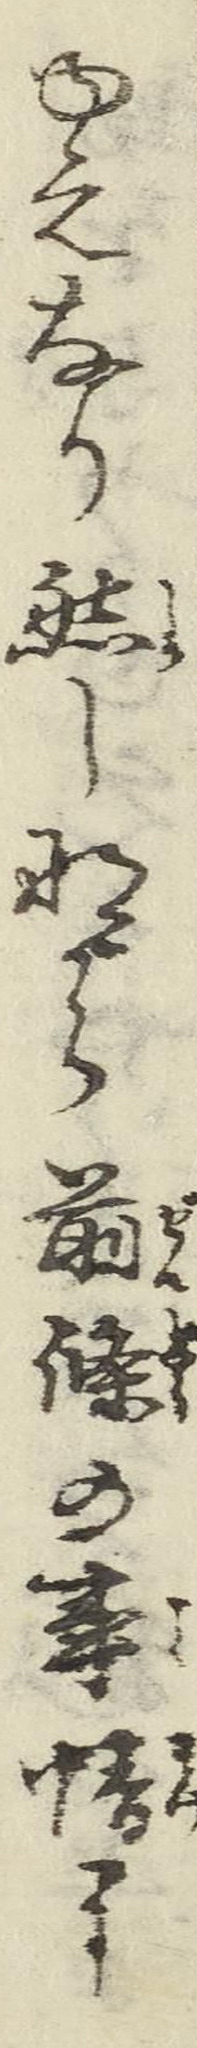ゆえなり然しながら前条の事情に
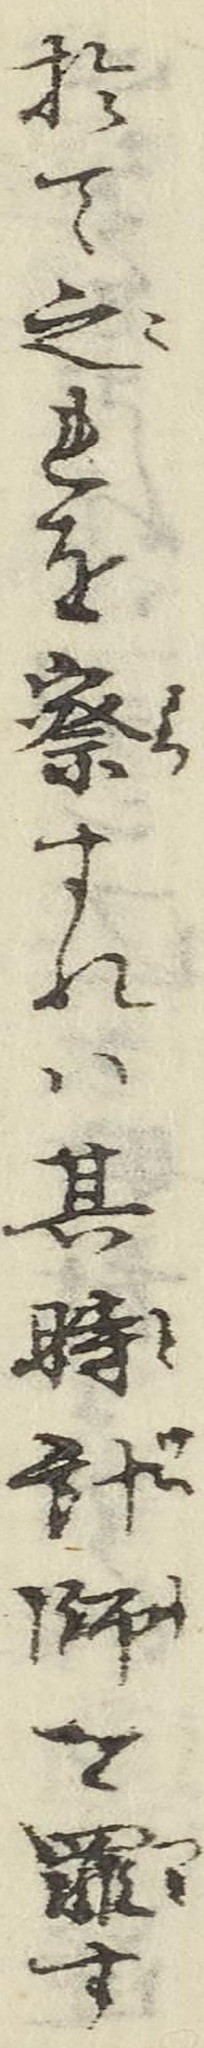於て之れを察すれは其時計師を罪す
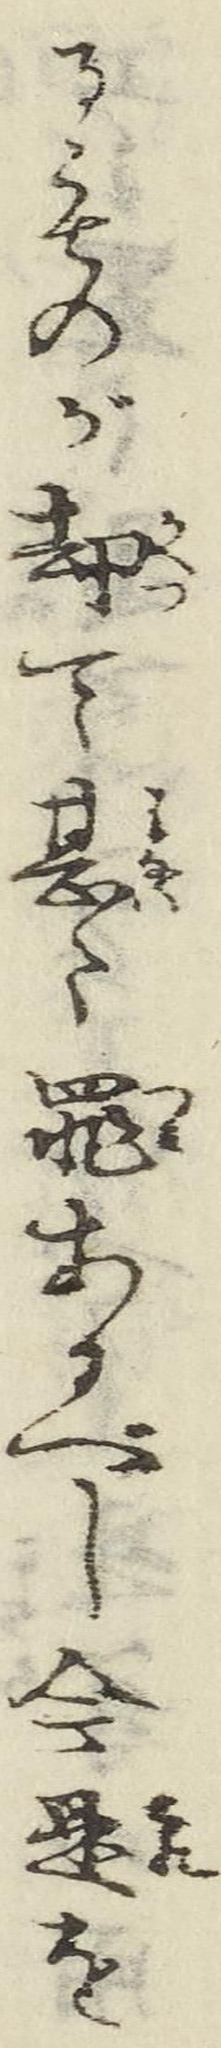るものが却て甚た罪あるべし今是を
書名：[時計に関する冊子]
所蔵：東京大学地震研究所図書室 Earthquake Research Institute Library, The University of Tokyo, JAPAN
